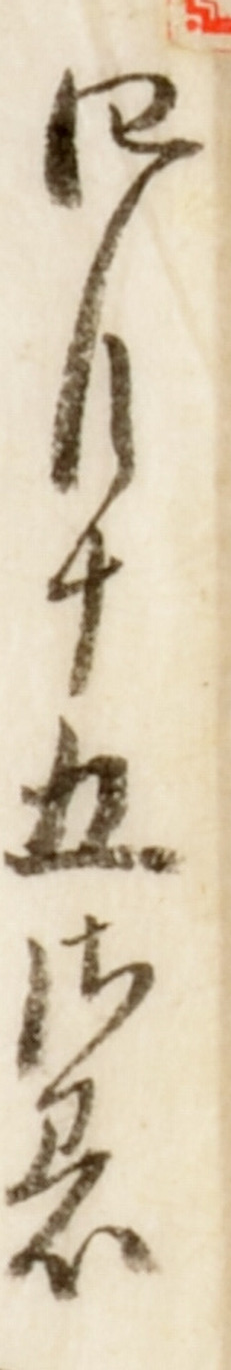四月十五日御着
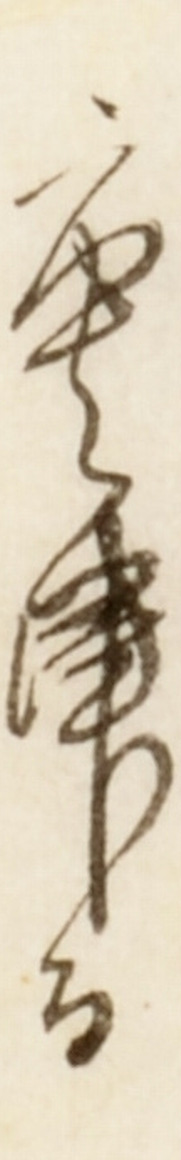唐津而

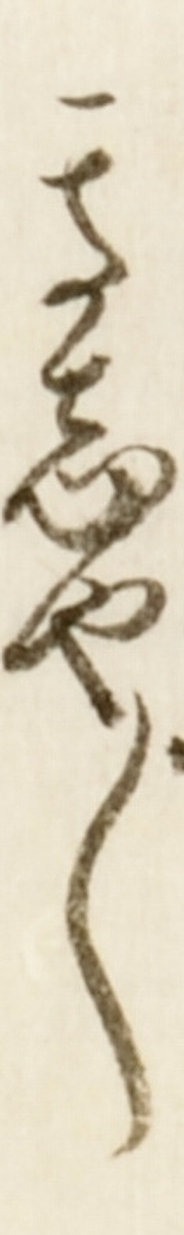きしや〳〵

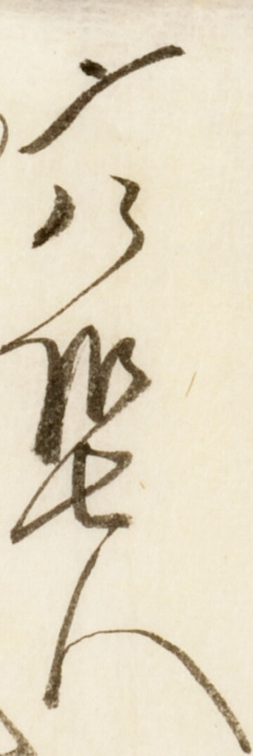〆八拾七人
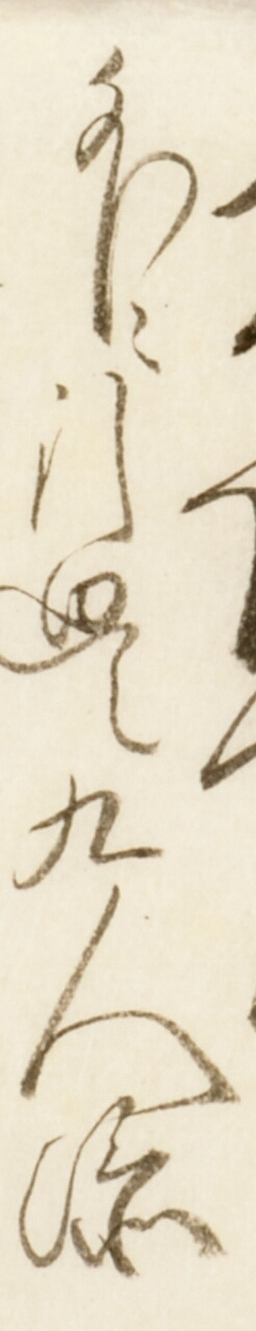外ニ引廻し九人添
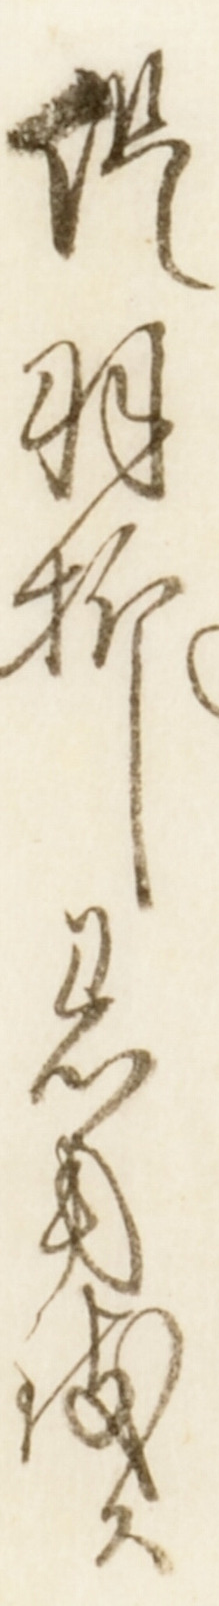但し羽折着用致ス
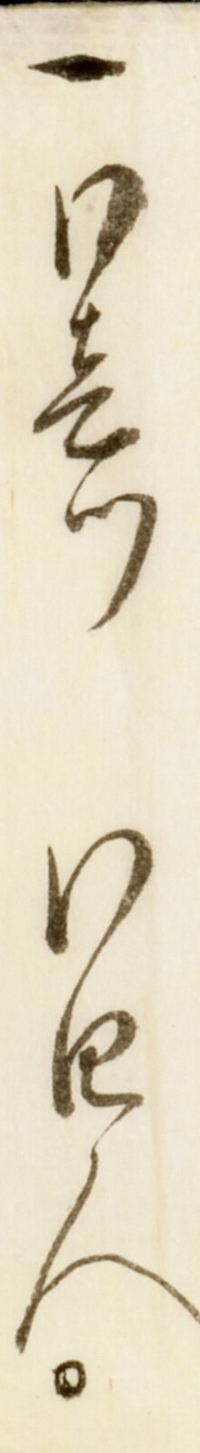一同壱ツ同四人○
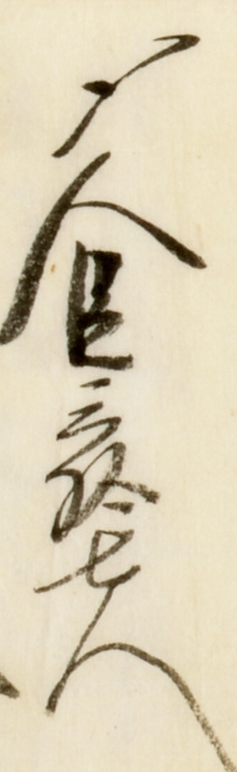〆人足三拾七人
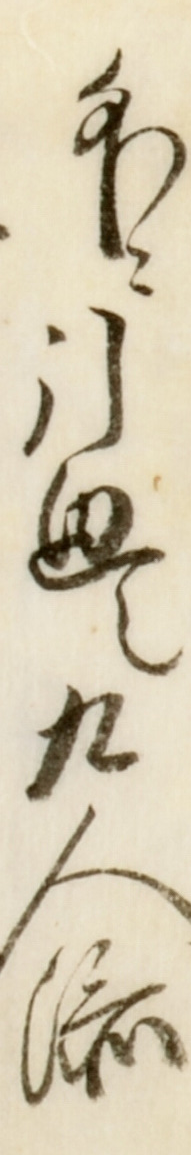外ニ引廻し九人添

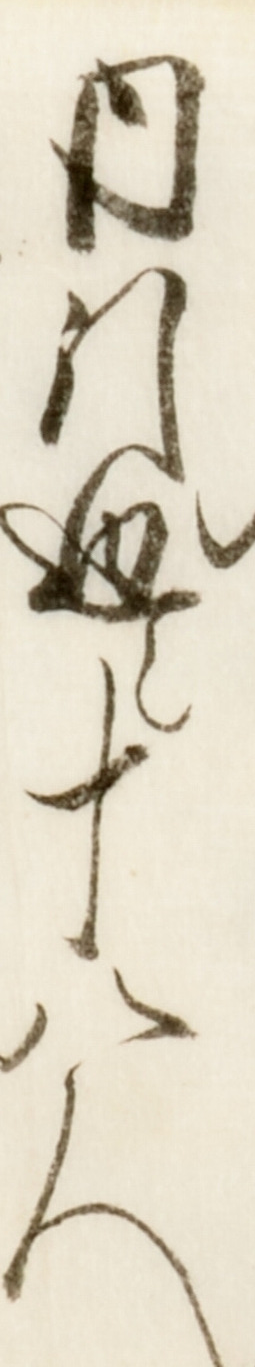同引廻し十八人
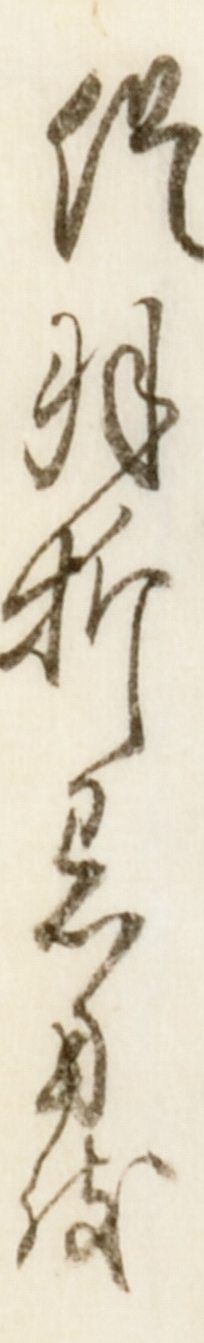但羽折着用致

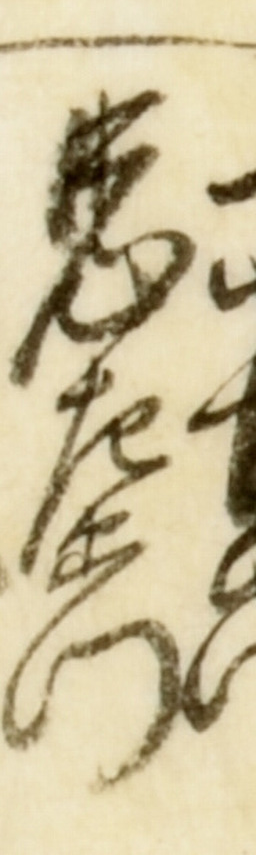忠左衛門
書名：人足書上
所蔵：伊那市立高遠町図書館・合同会社AMANE
